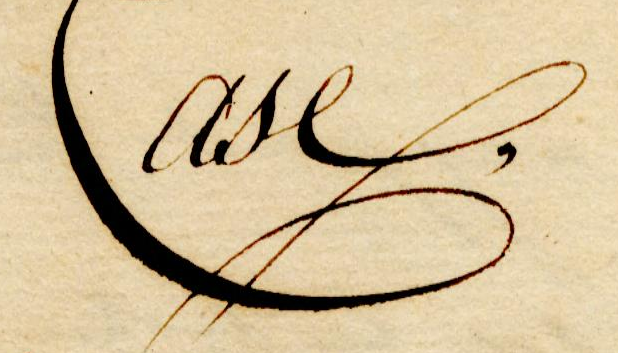Case,
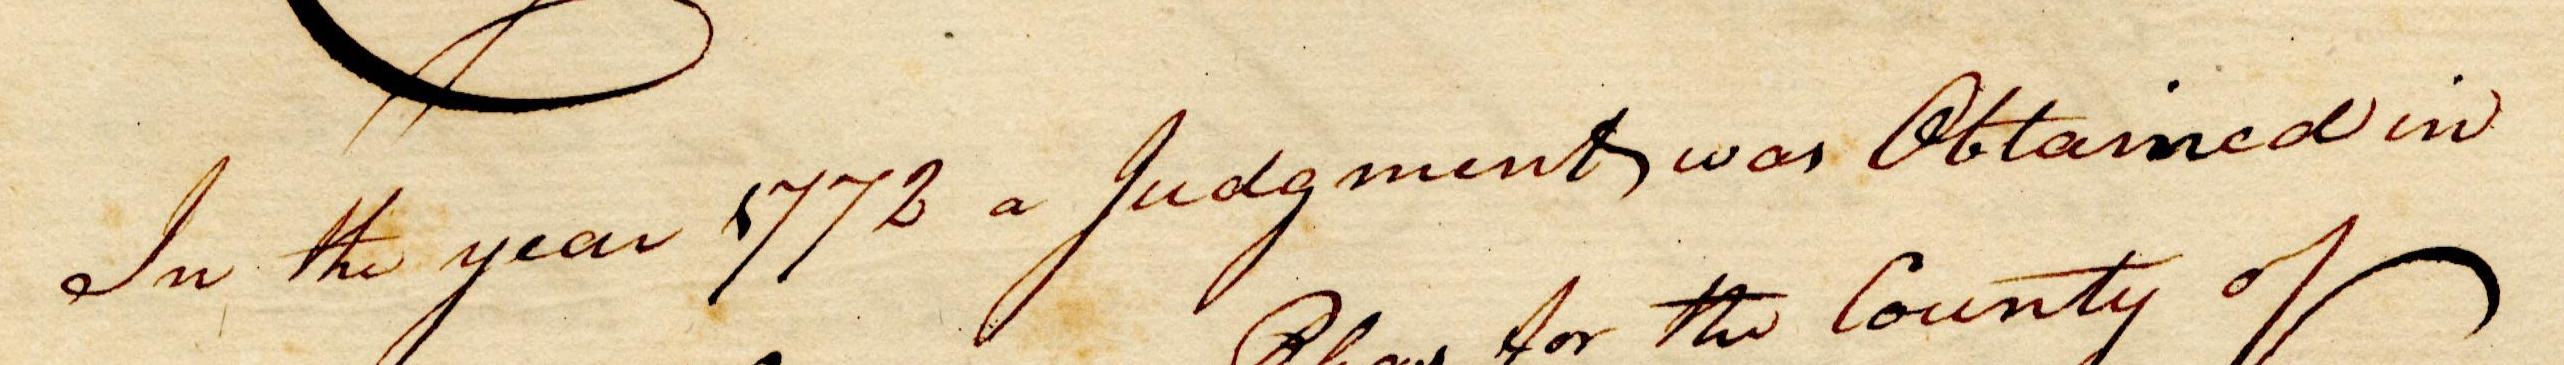In the year 1772 a Judgment, was Obtained in
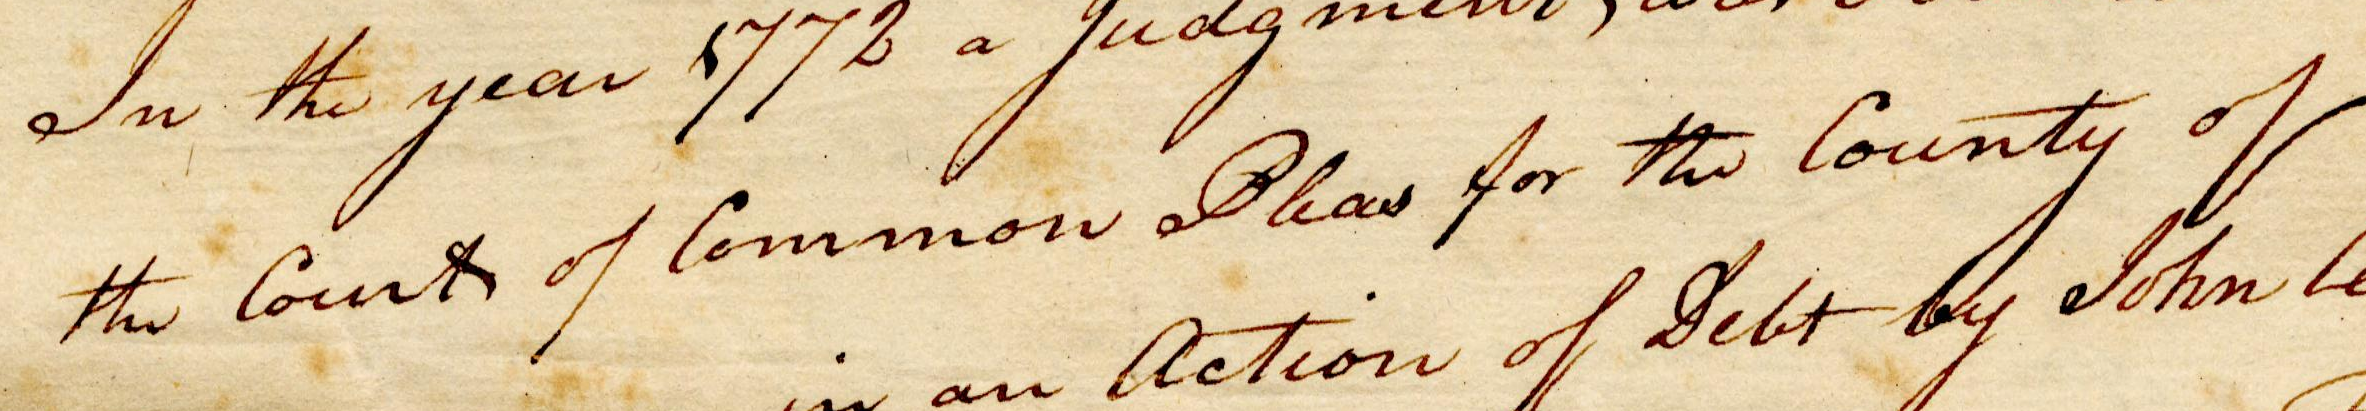the Court of Common Pleas for the County of
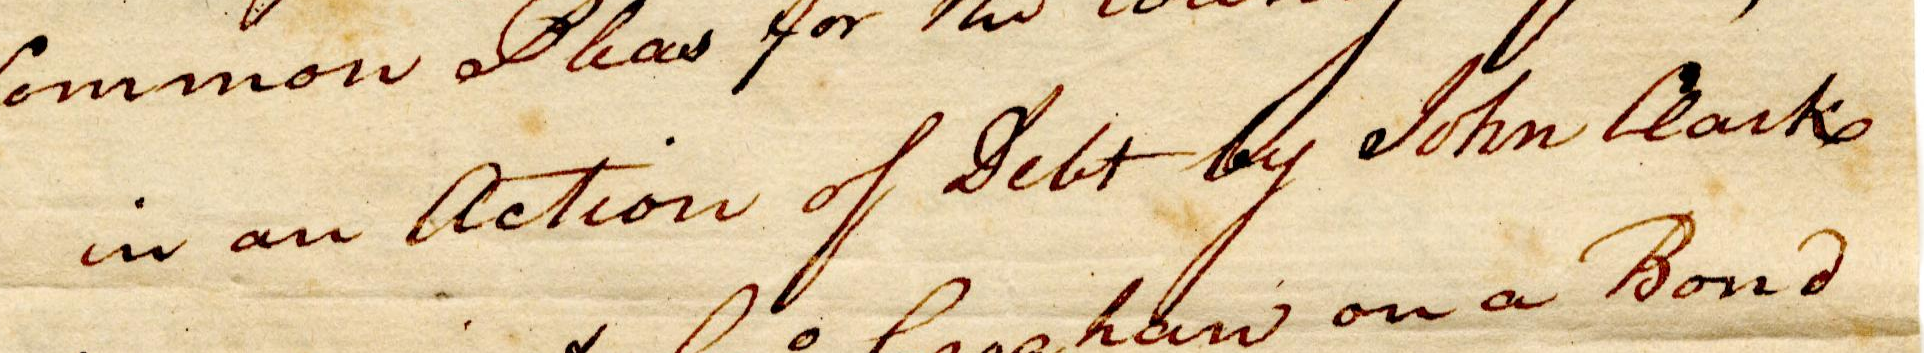in an Action of Debt by John Clark
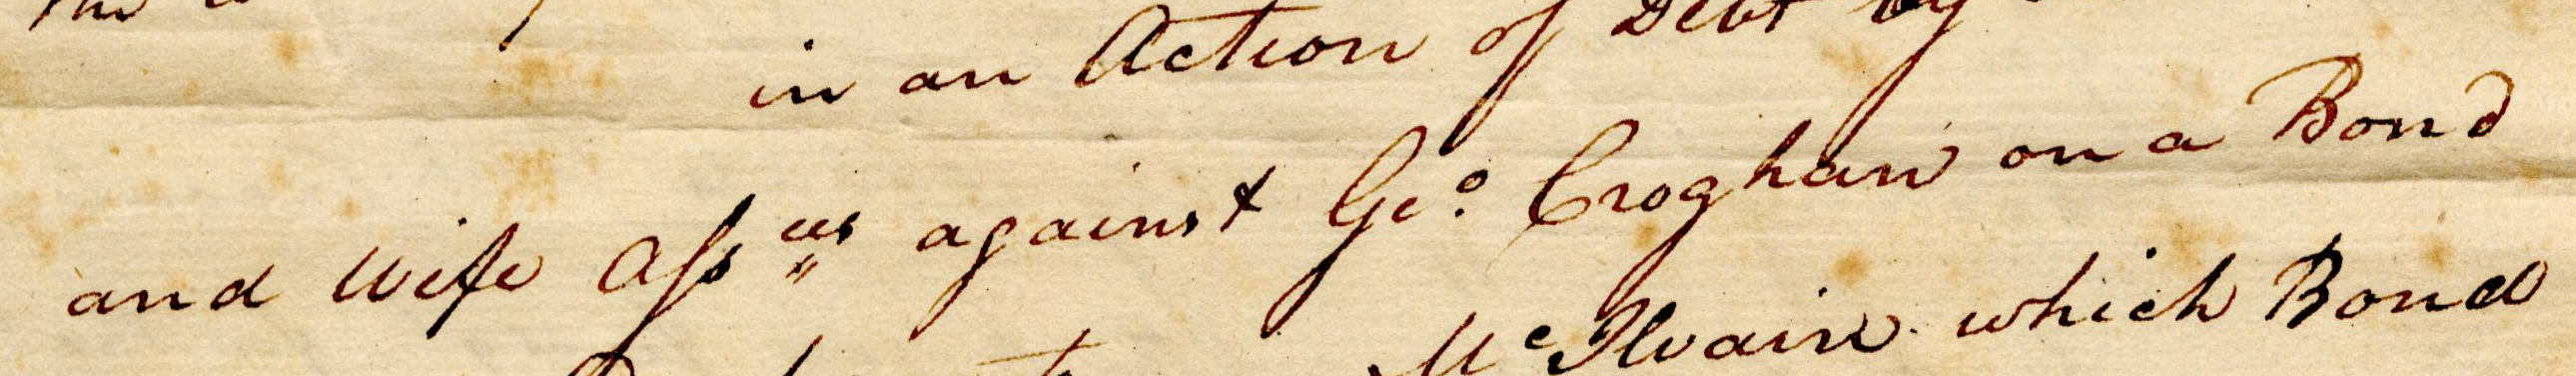and wife ass^es against Ge^o. Croghan on a Bond
